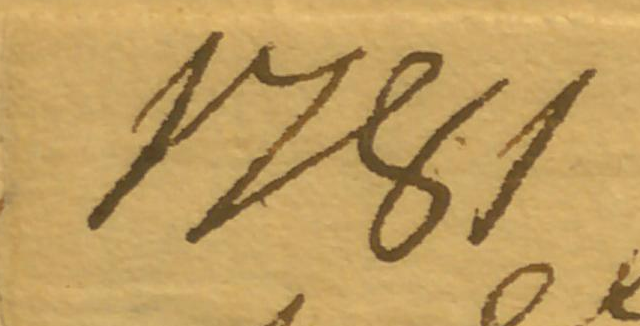1781
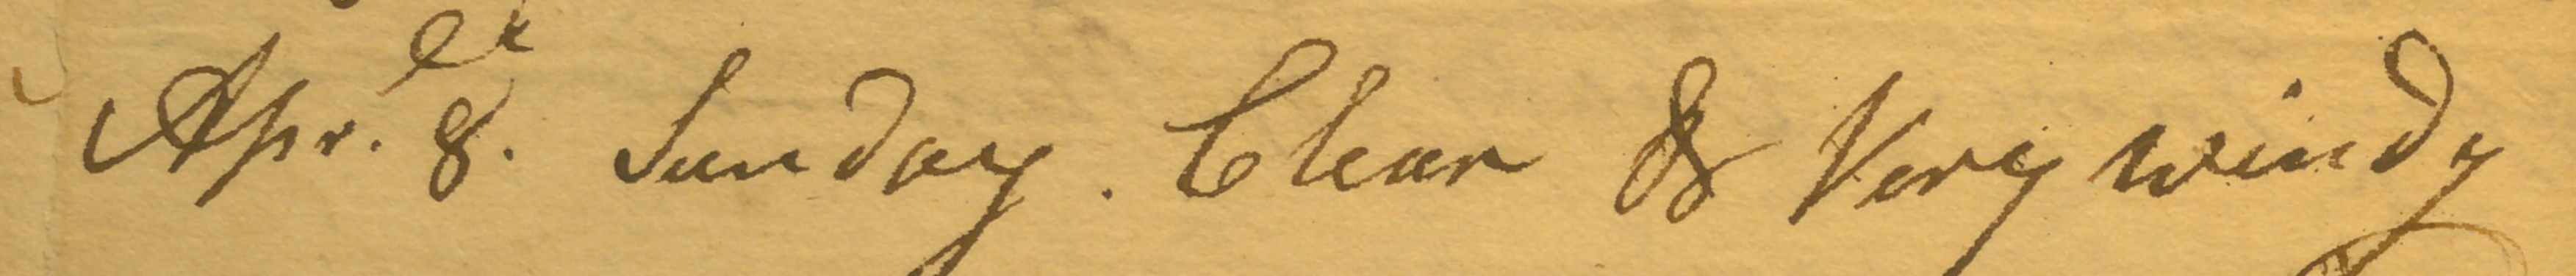Apr^l. 8. Sunday Clear & Very windy
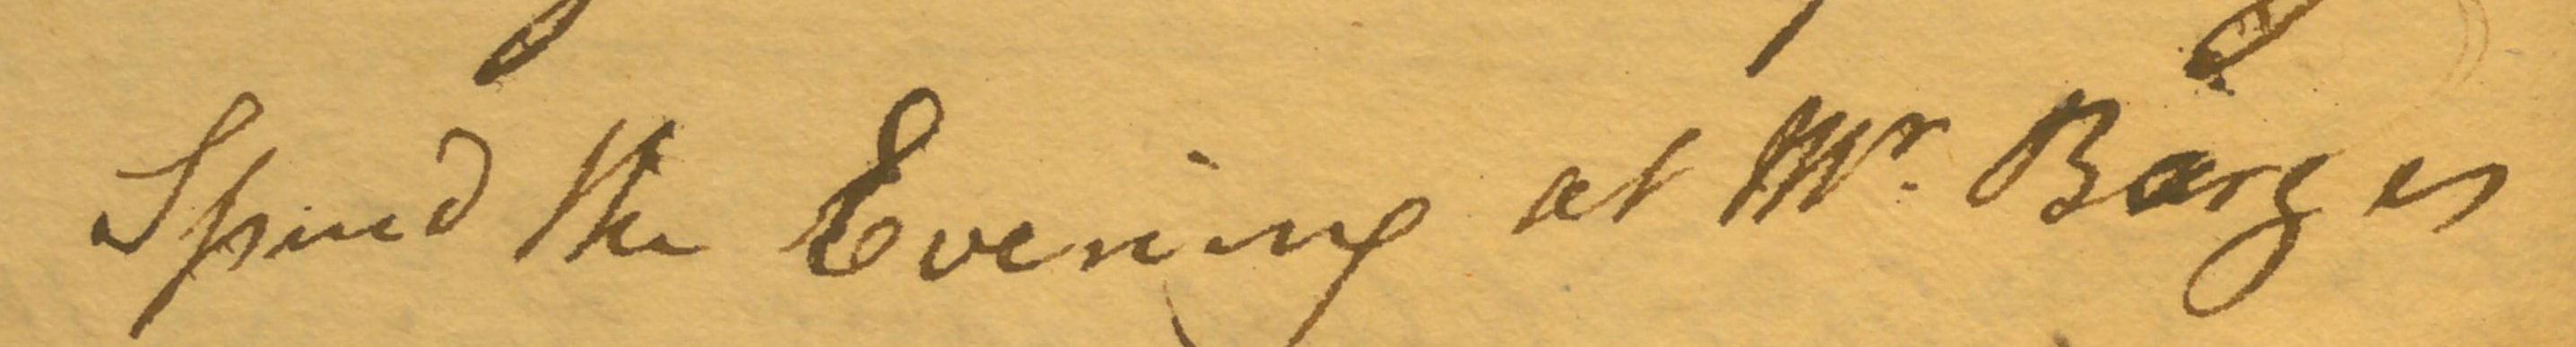Spend the Evening at M^r. Barges
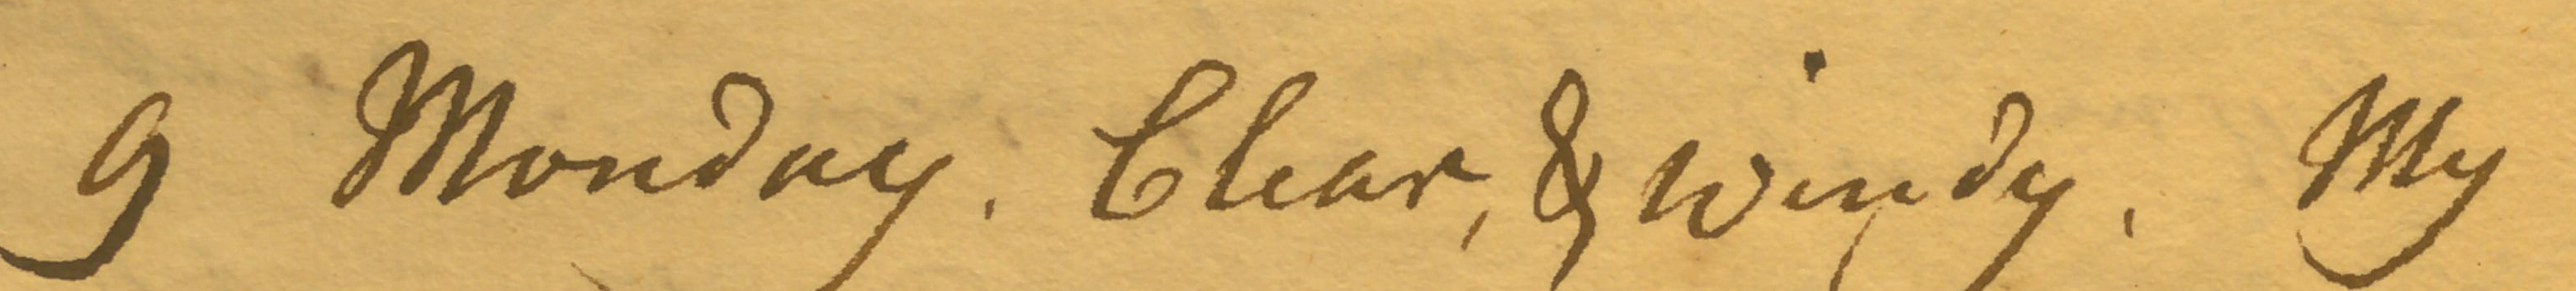9 Monday, Clear & windy My
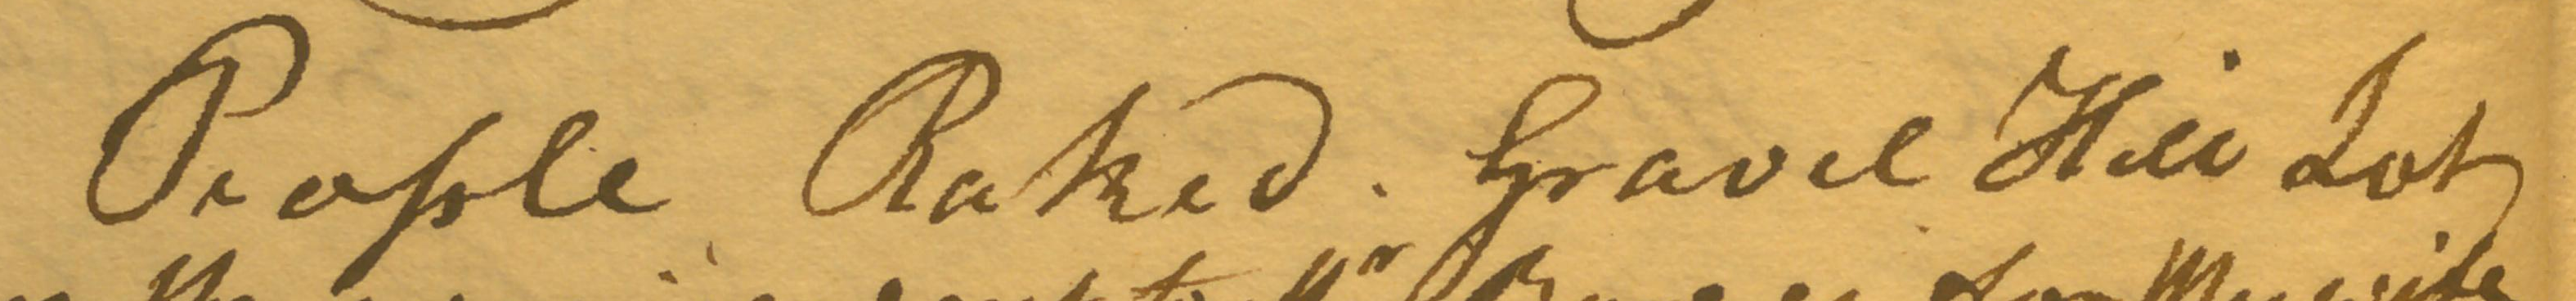People Raked. Gravel Hill Lot
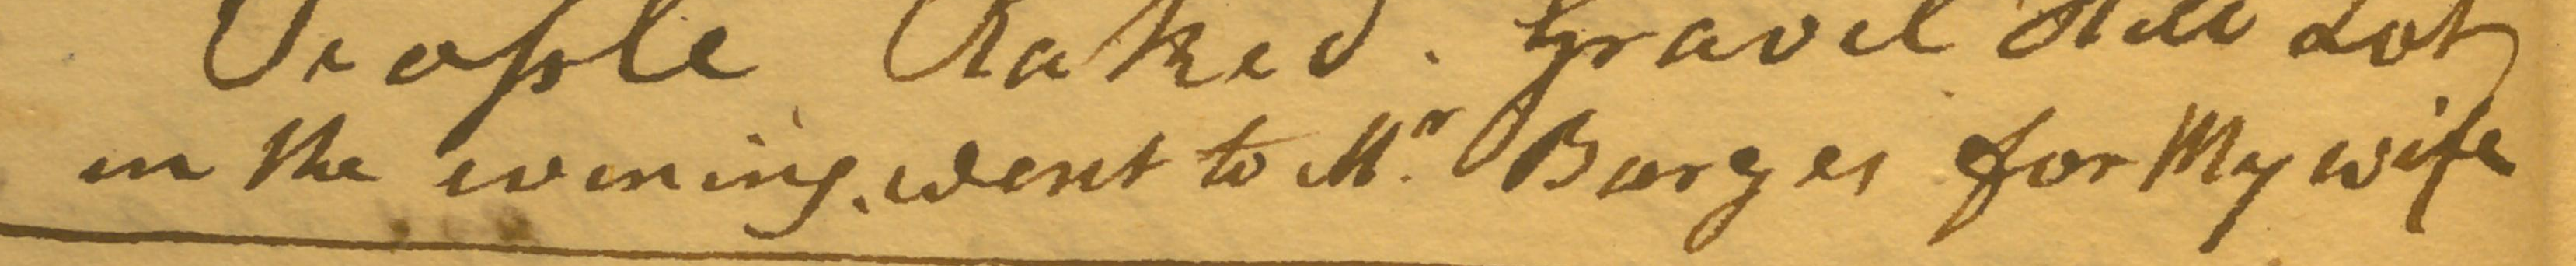in the evening went to M^r. Barges for My wife
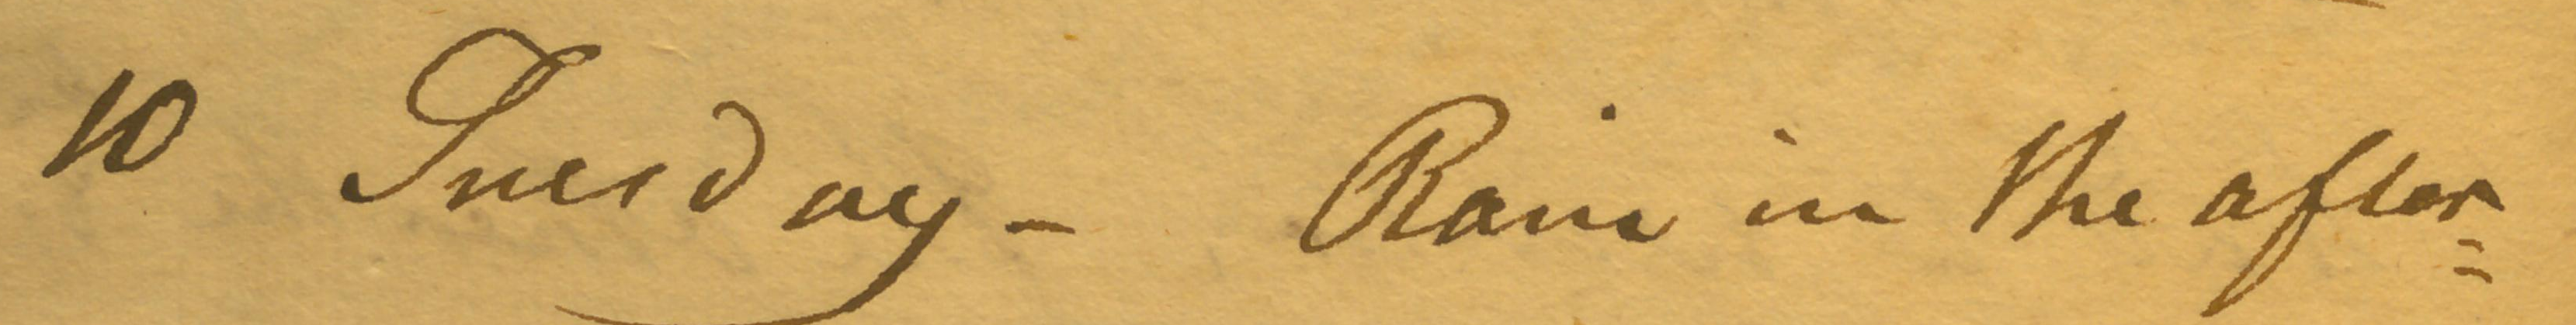10 Tuesday- Rain in the after-
